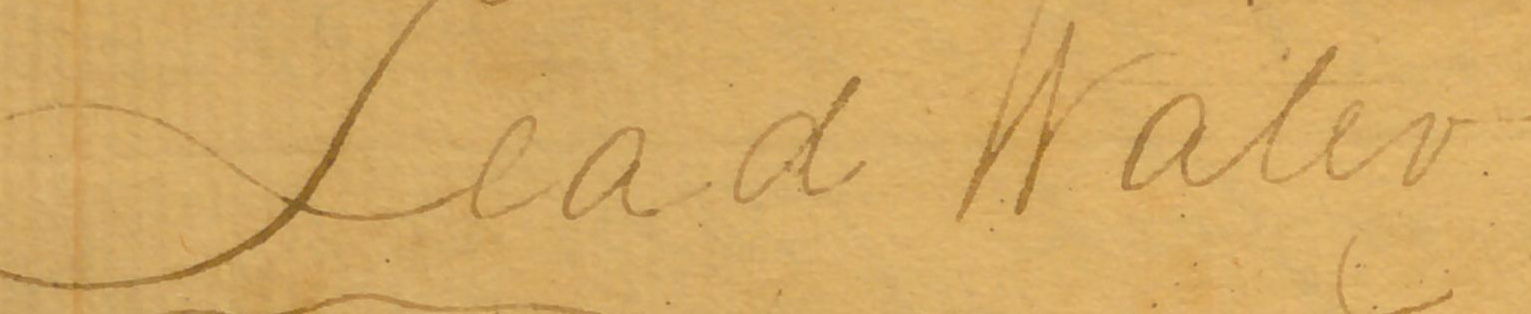Lead Water
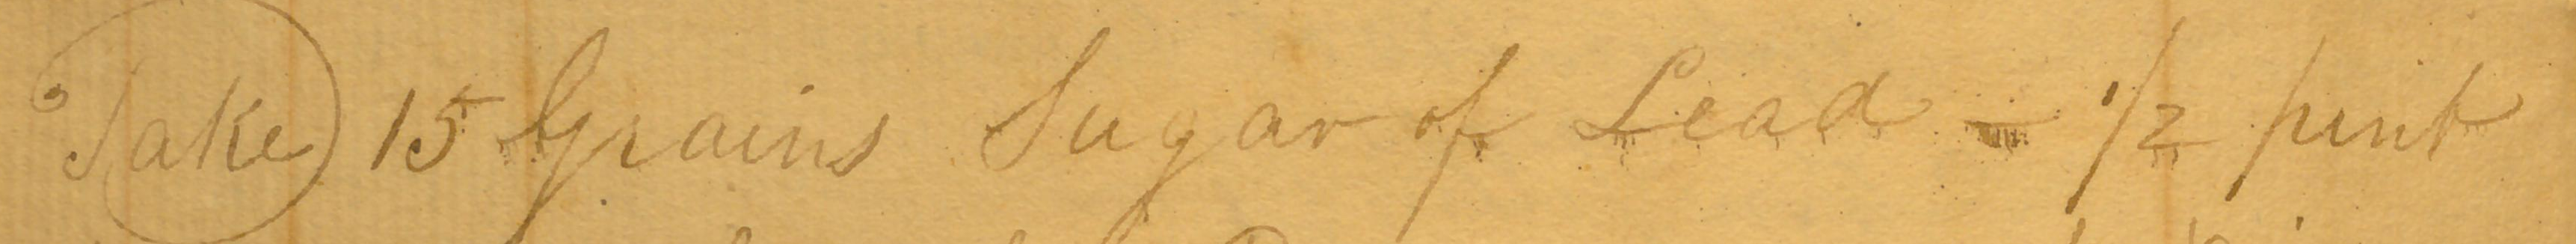Take 15 Grains Sugar of Lead- 1/2 pint
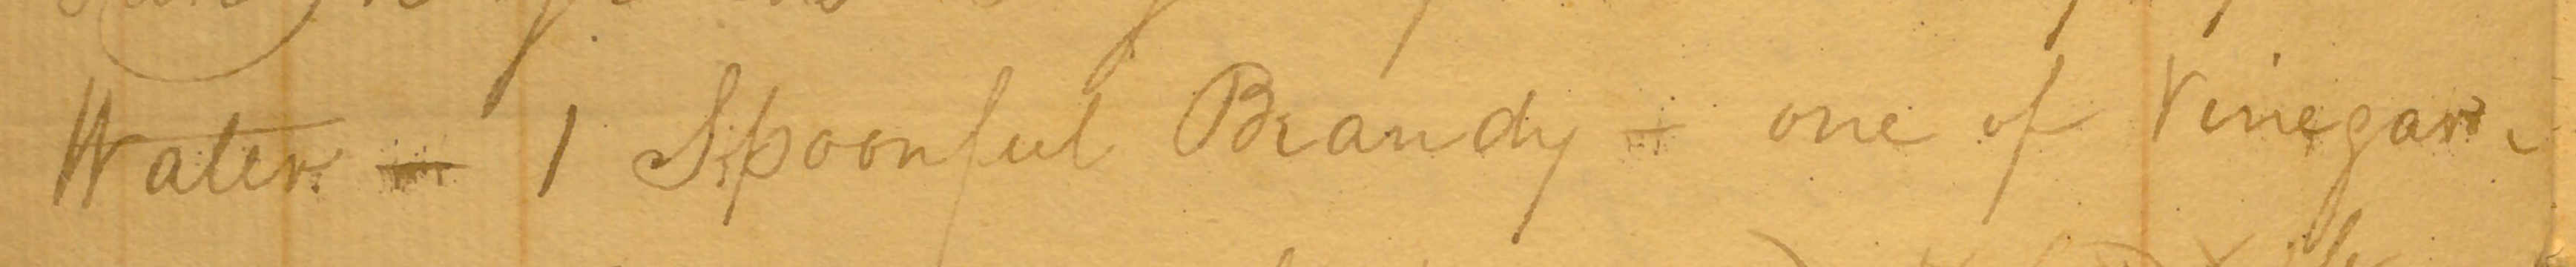Water- 1 Spoonful Brandy- one of Vinegar-
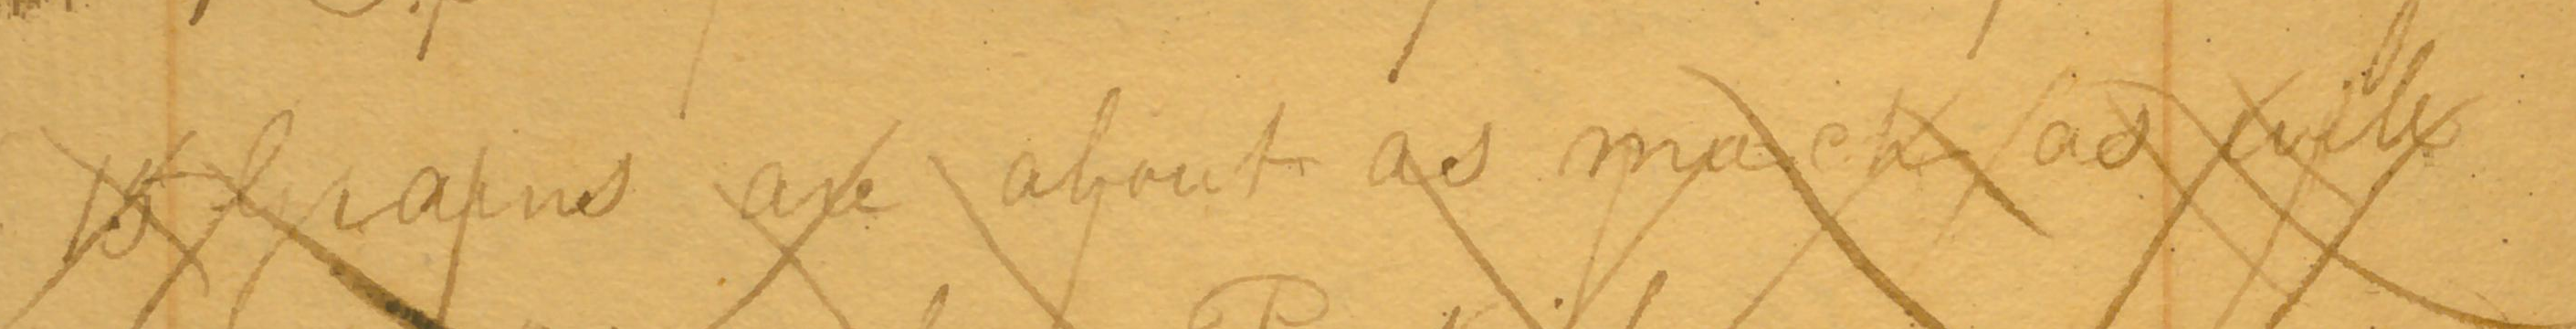15 Grains are about as much will
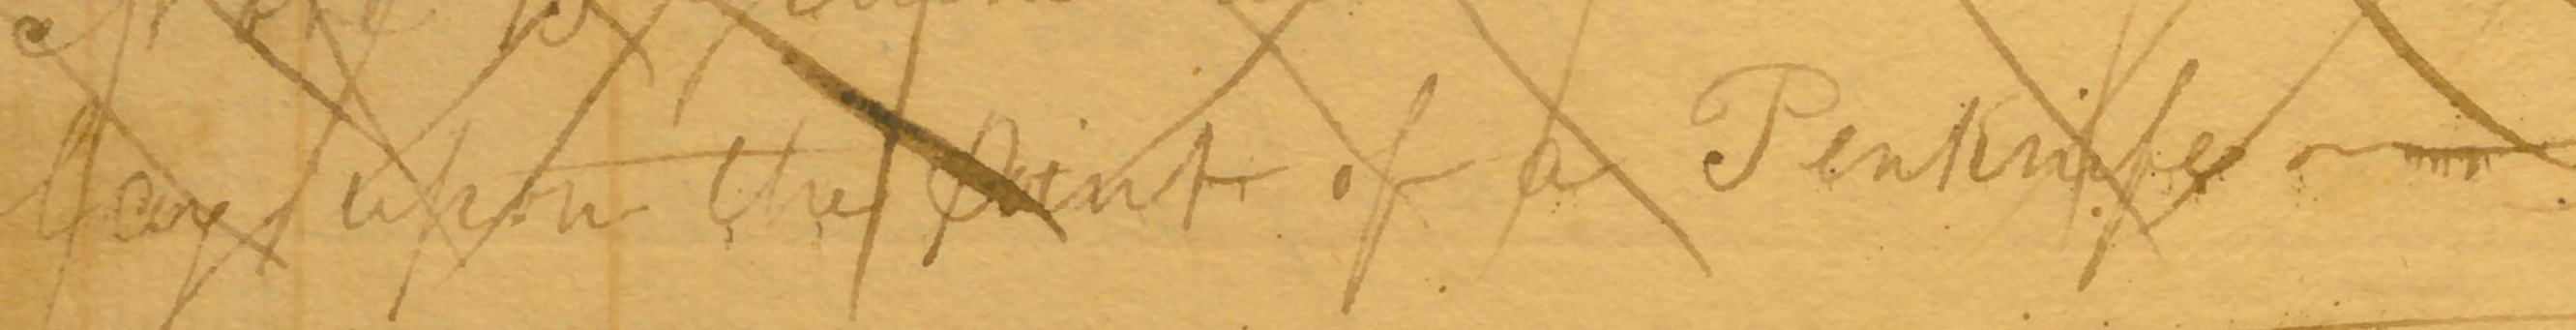lay upon the Point of a Penknife-
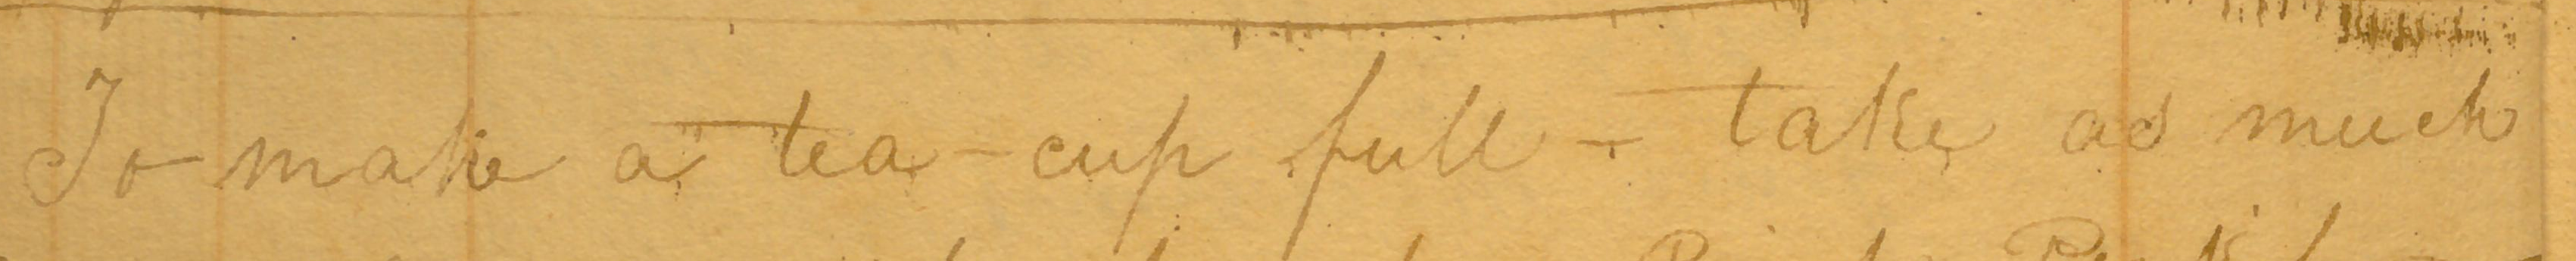To make a tea-cup full- take as much
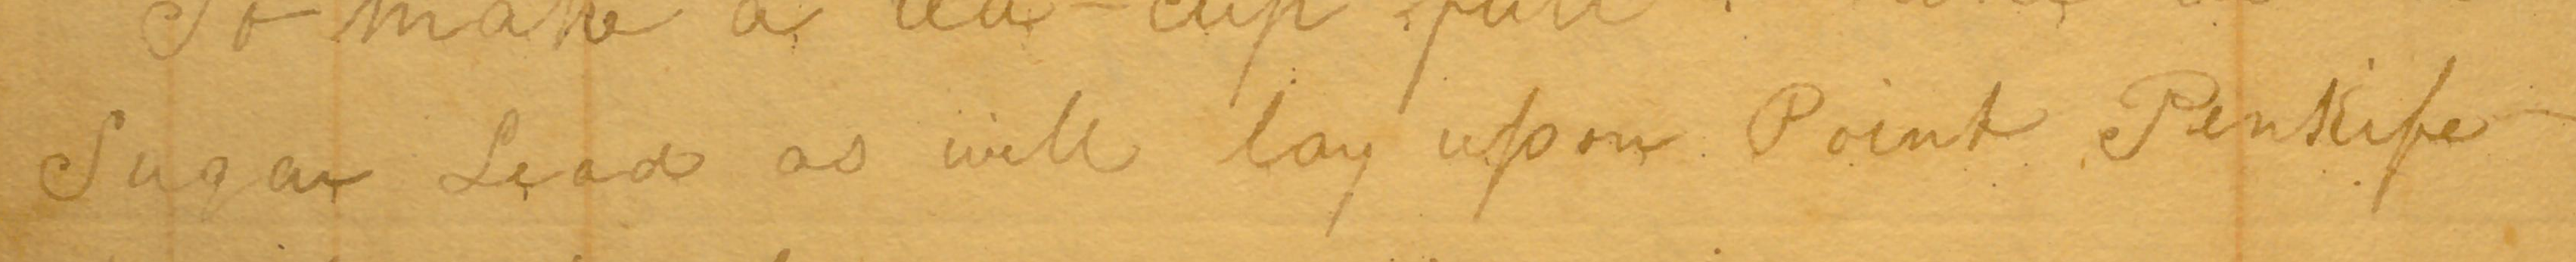sugar Lead as will lay upon Point Penknife
